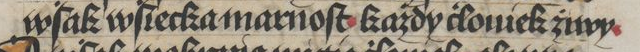wẛak wẛiecka marnoſt každy ċlouíek żiwy.
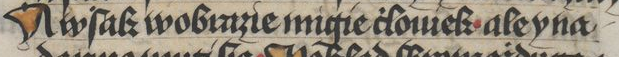A wẛak wobrazie migíe ċlouiek.ale y na¬
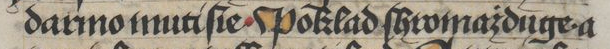darmo mutí ſie.Poklad ſhromażduge.a
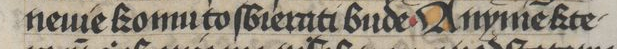neuíe komu to ſbierati bude.A nyníe kte¬
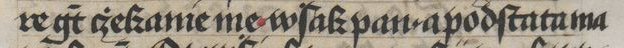ro ḡt cżekaníe me.wẛak pan.a podſtata ma
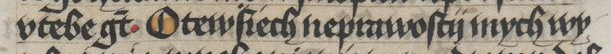v tebe ḡt.Otewẛíech neprawoſtij mych wy¬
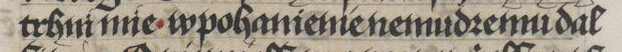trhni mie.w pohanieníe nemudremu dal
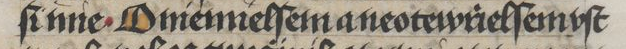ſi mie.Oníemíelſem a neotewṙielſem vſt
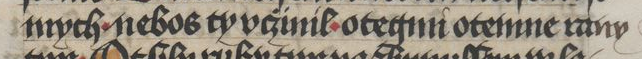mych.nebos ty vcżinil.otegmi otemne rány¬
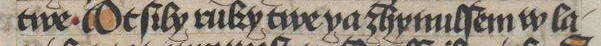twe.Ot ſily ruky twe ya zhynulſem w la¬
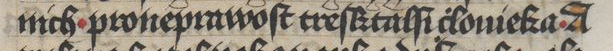ních.proneprawoſt treſktalſi ċlouieka.A
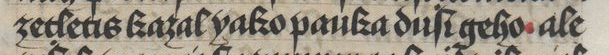zetletis kazal yako pauka duẛi geho.ale
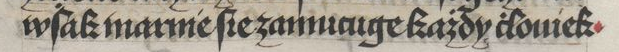wẛak marnie ſie zamucuge každy člouiek.
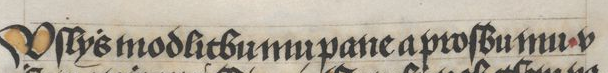Vſlyṡ modlitbu mu pane a proſbu mu.v¬
